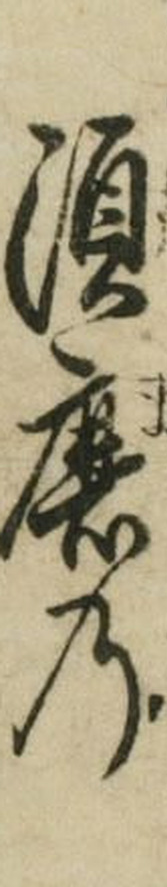須磨の
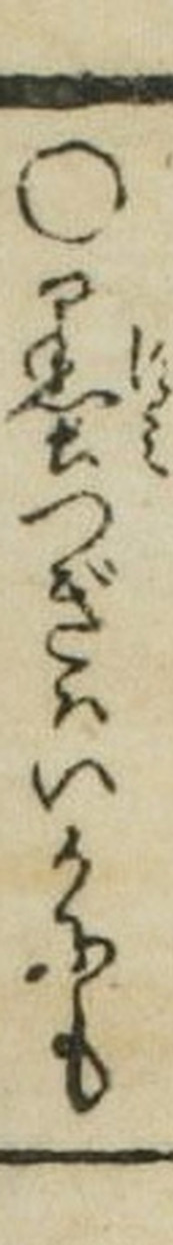○墨つぎはいかにも
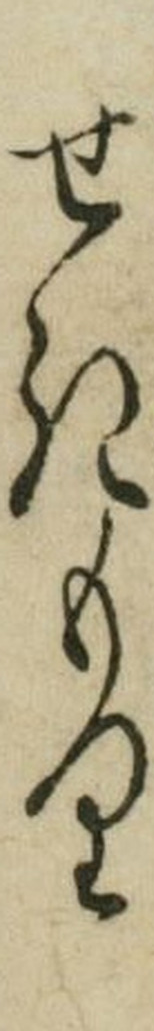せきもり
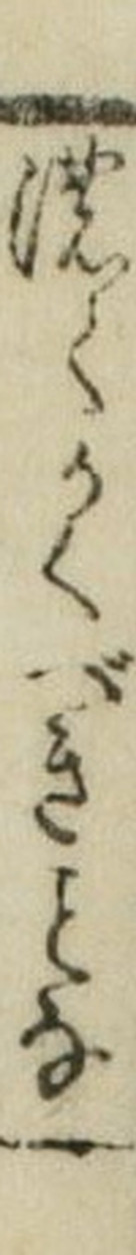濃くかくべきことな
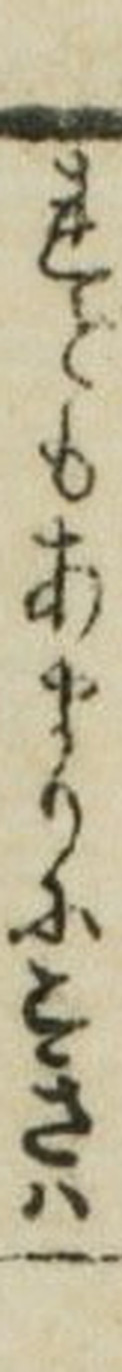れどもあまりにこきは
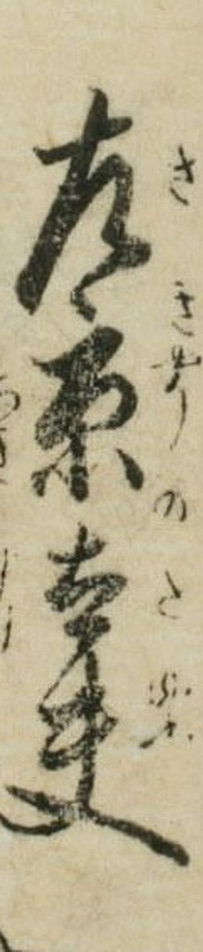左京太夫
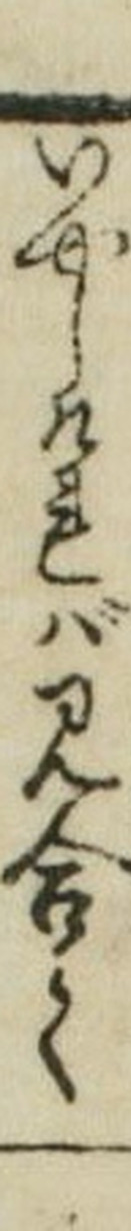いやしければ見合て
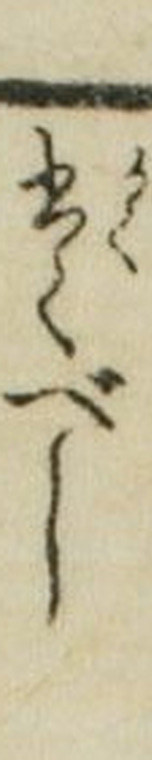書くべし
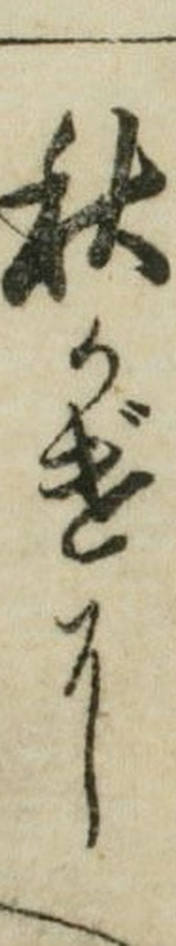秋かげに
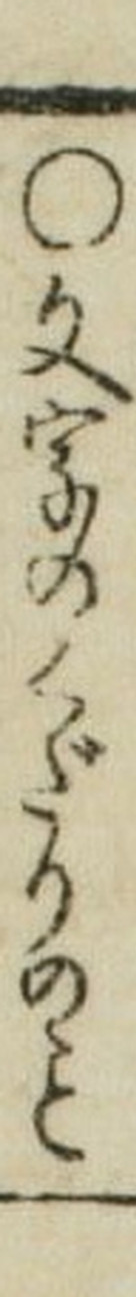○文字のくだりのこと
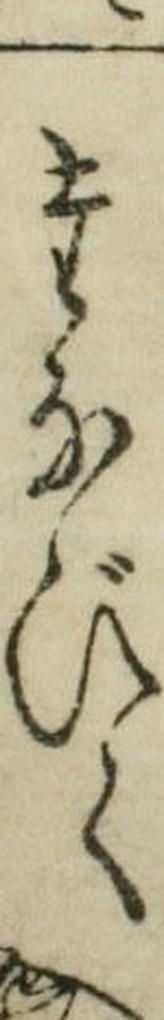たなびく
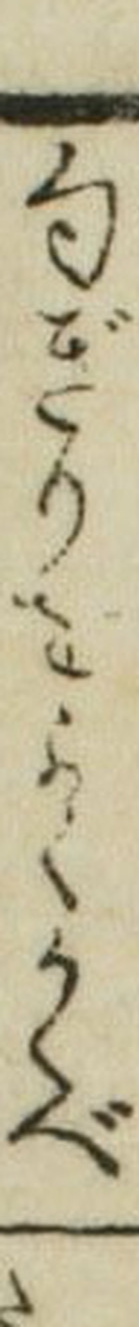句ぎりをよくかくべし
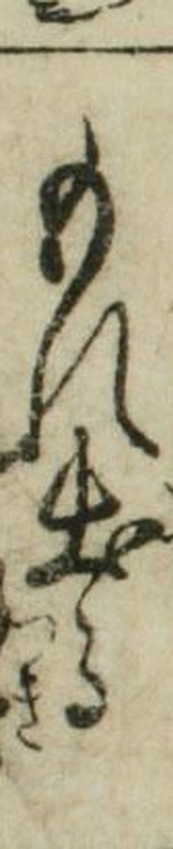もれ出る
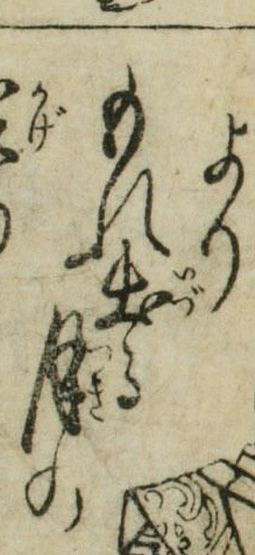もれ出る
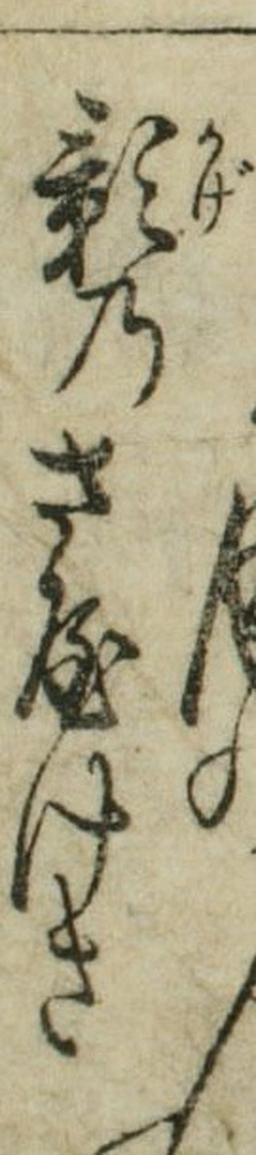影のさやけさ

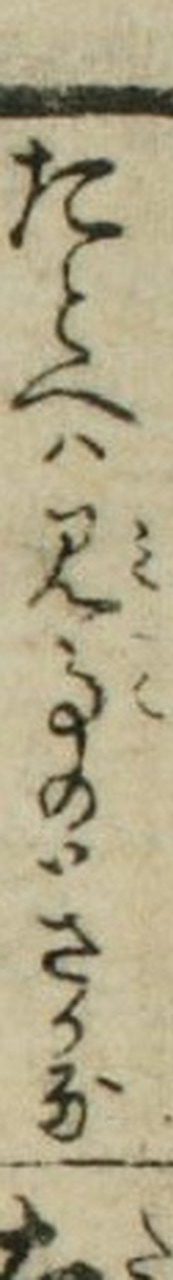たとへは見事の御さかな
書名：百人一首
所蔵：東京学芸大学教育コンテンツアーカイブ
